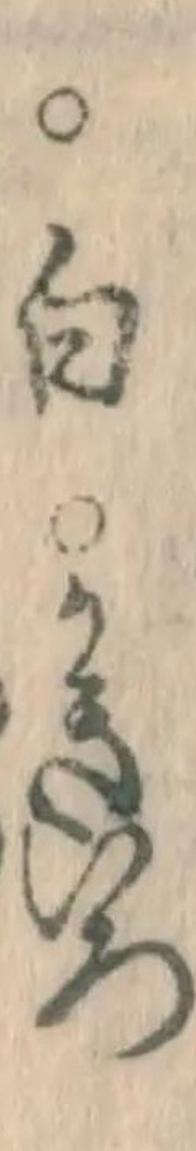〇白〇かきいろ
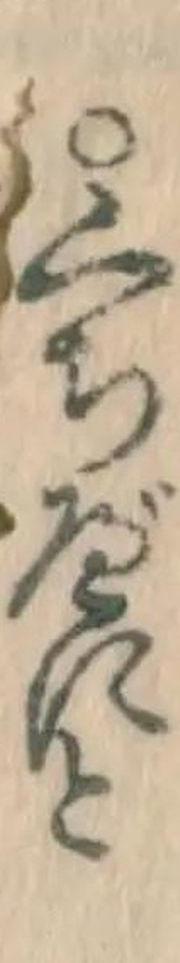〇くちべにと
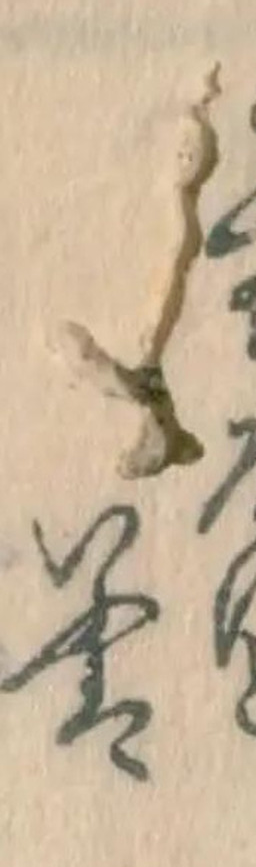いふは
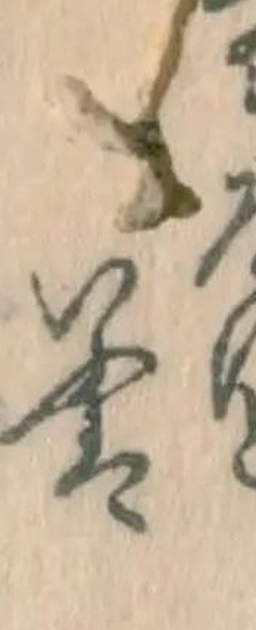いふは
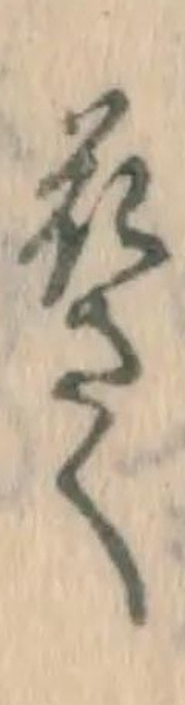花さく
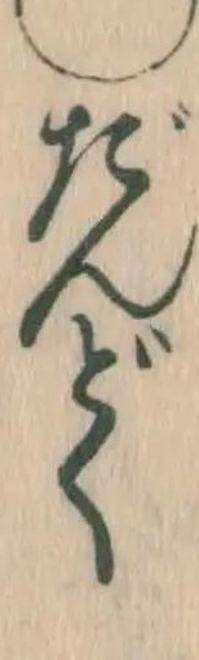〇だんどく
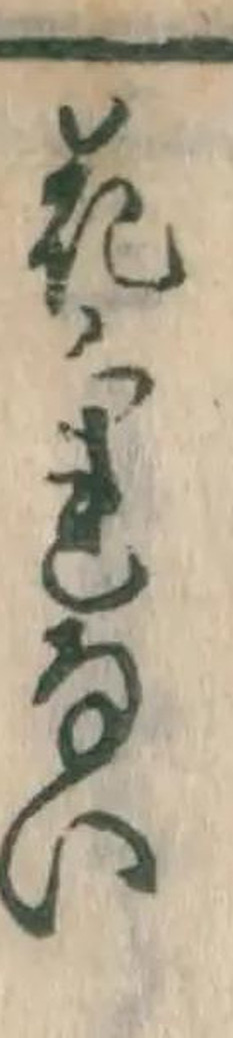花くれない
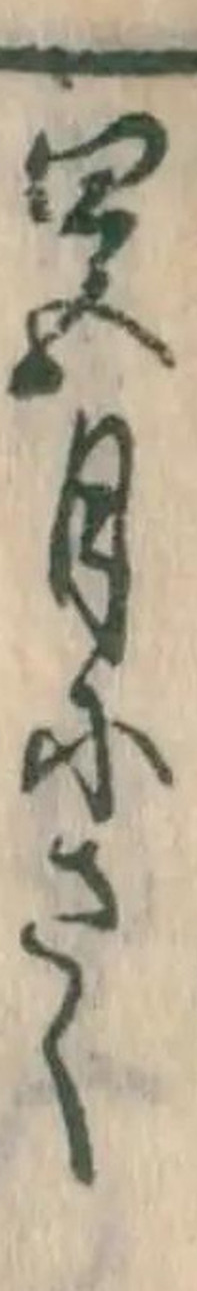四五月にさく
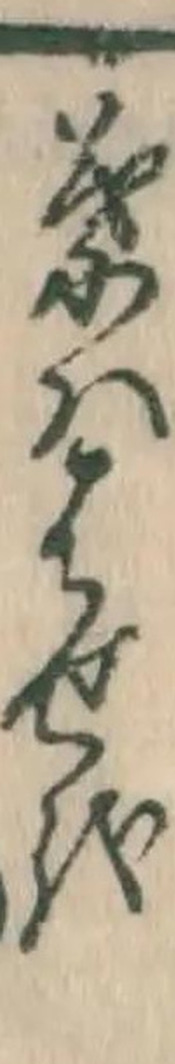葉ははせを
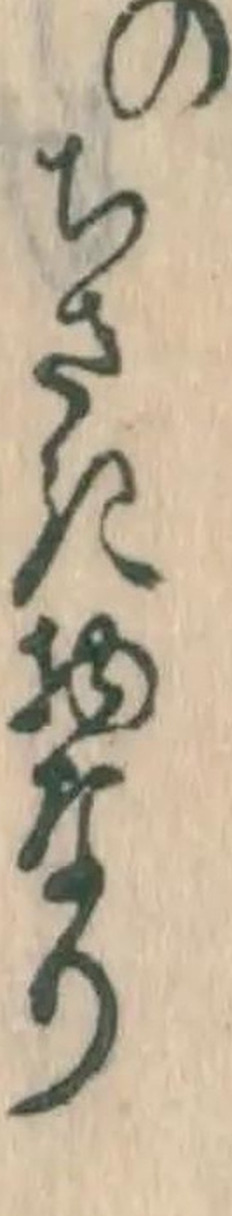のちさき物なり

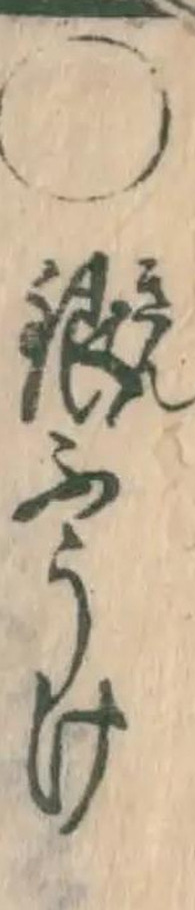〇銀ふうけ
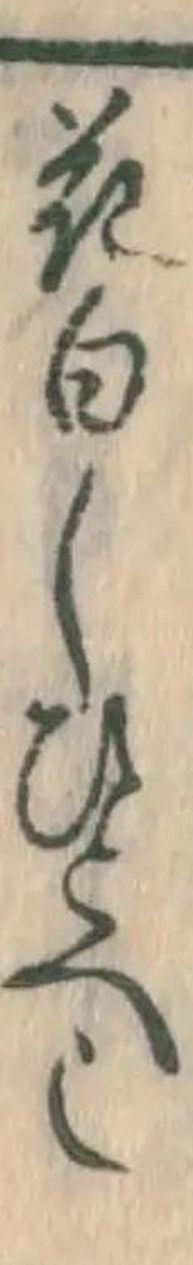花白くひとへ也
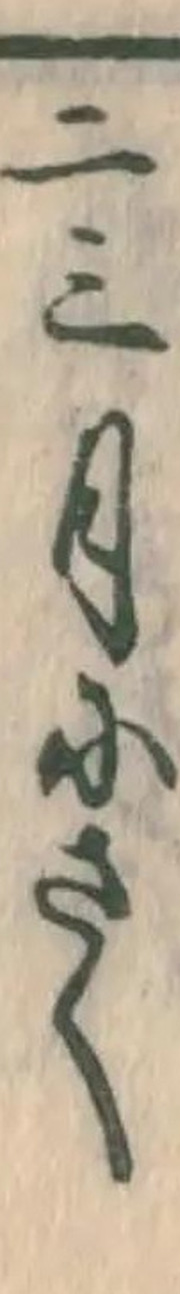二三月にさく
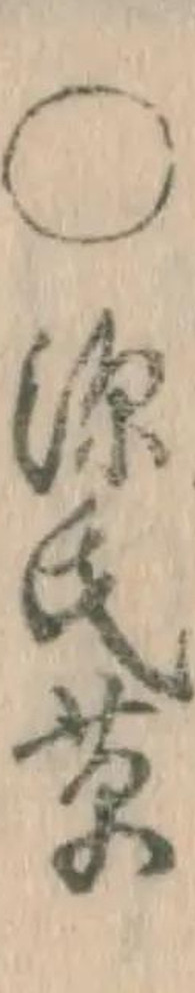〇源氏草
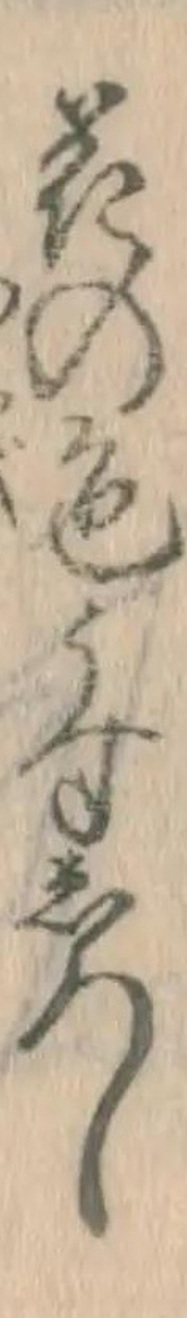花の色うすしろく
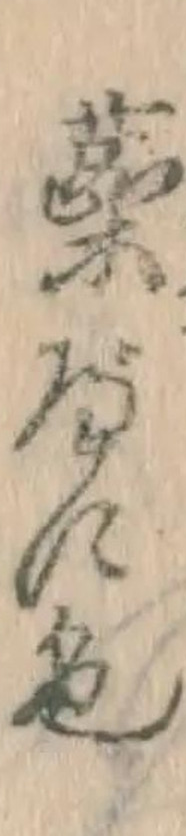蘂べに色
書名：艸花繪前集. [2]
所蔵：国立国会図書館 National Diet Library, JAPAN
